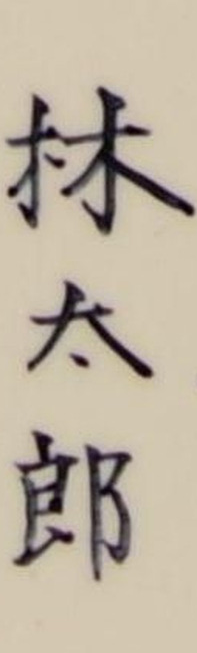林太郎
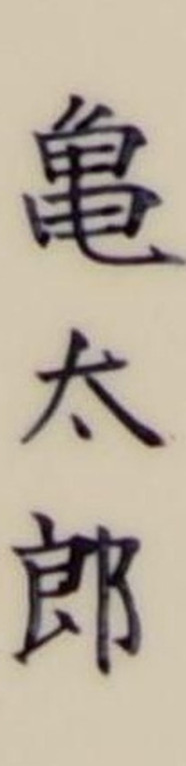亀太郎
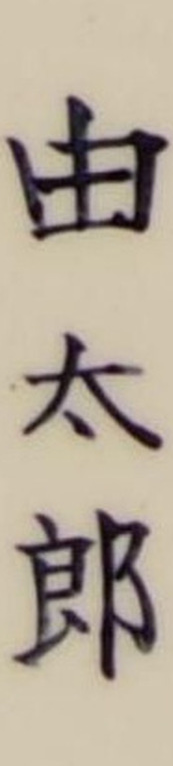由太郎

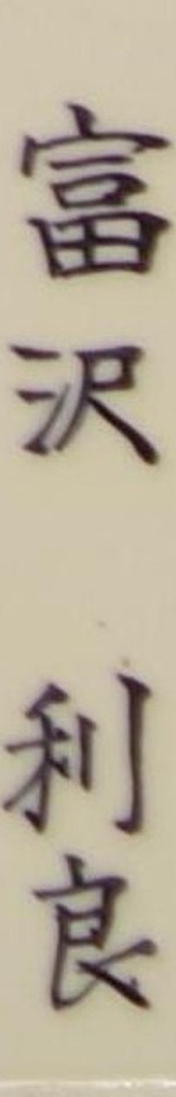富沢利良
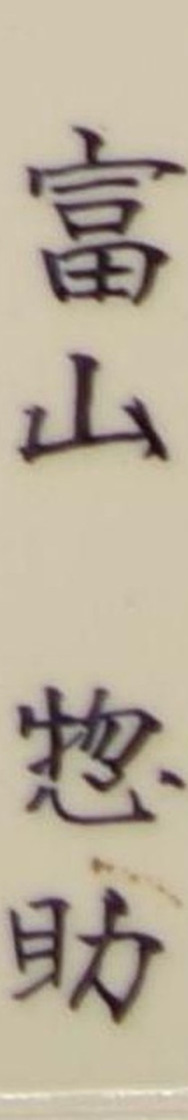富山惣助
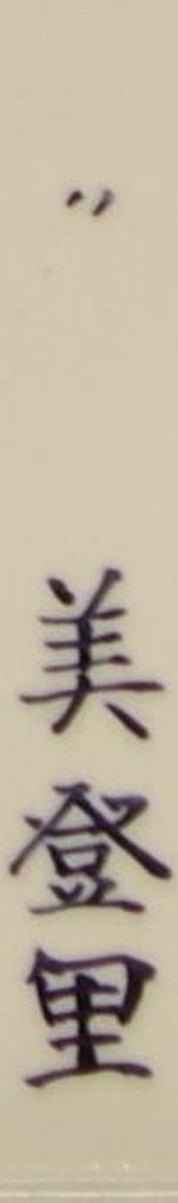美登里
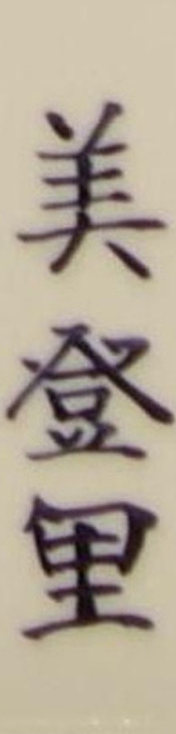美登里
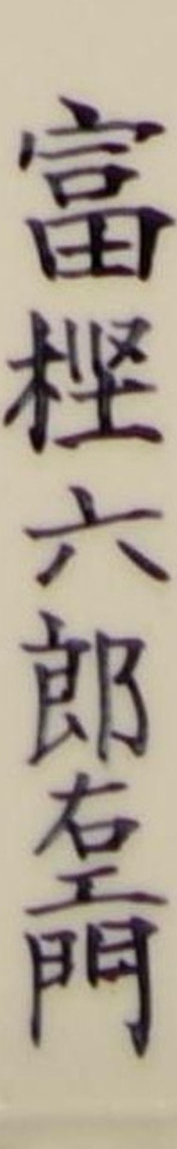富樫六郎右エ門
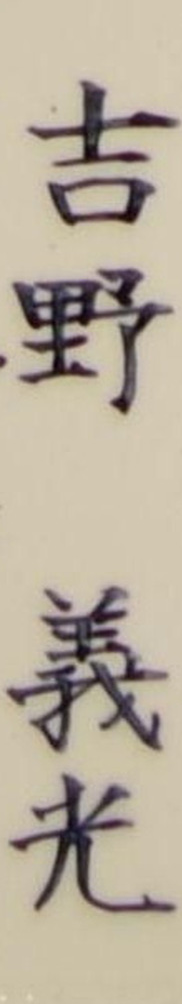吉野義光
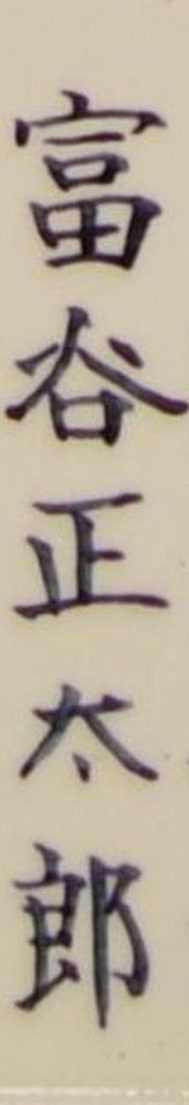富谷正太郎
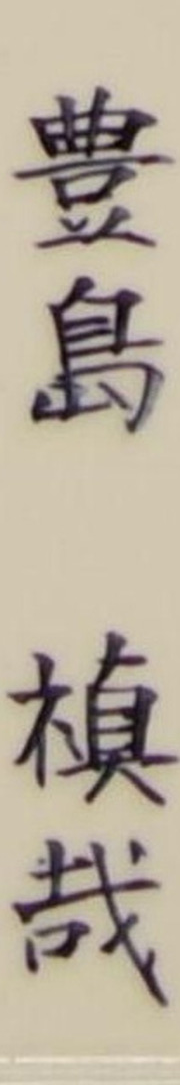豊島禎哉
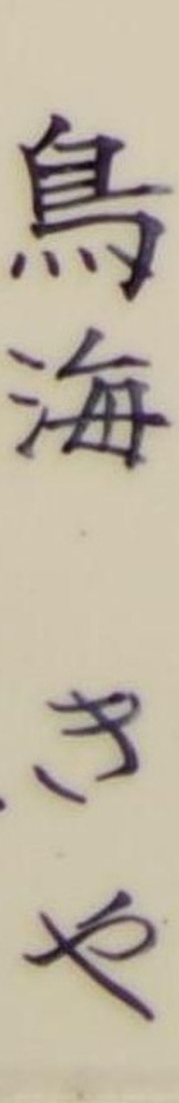鳥海きや
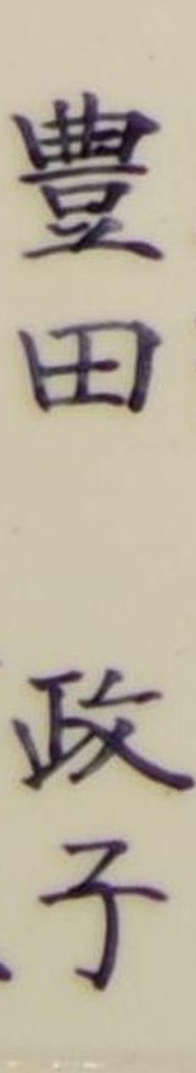豊田政子

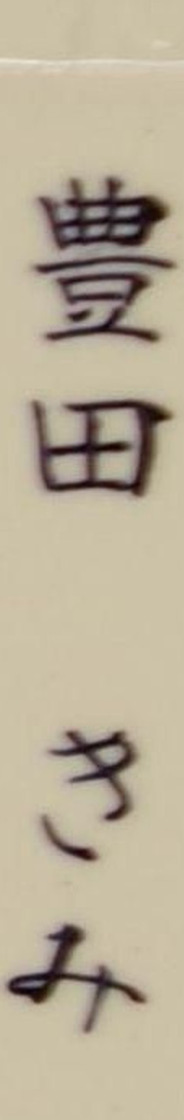豊田きみ
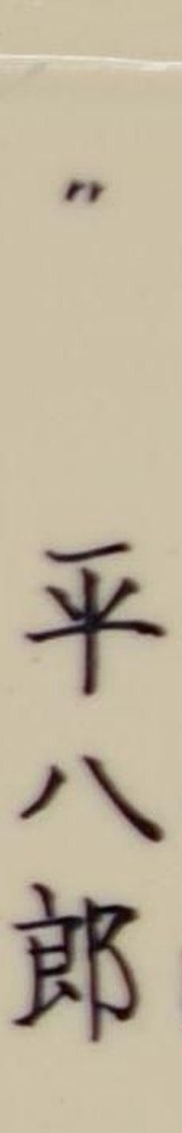平八郎
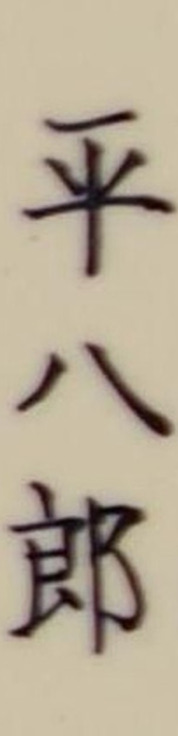平八郎
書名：A~D
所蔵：koyasan kongobuji
